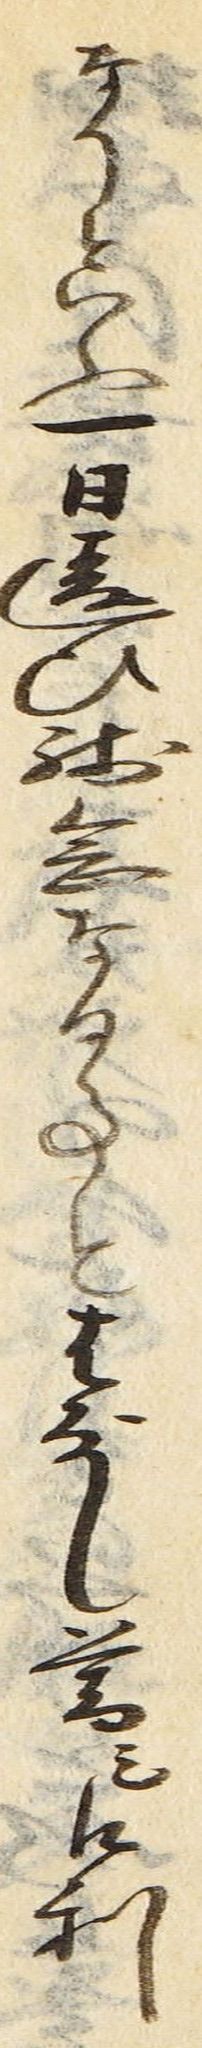なりしといふ一日違ひ残念なる事とはなし暮しけり
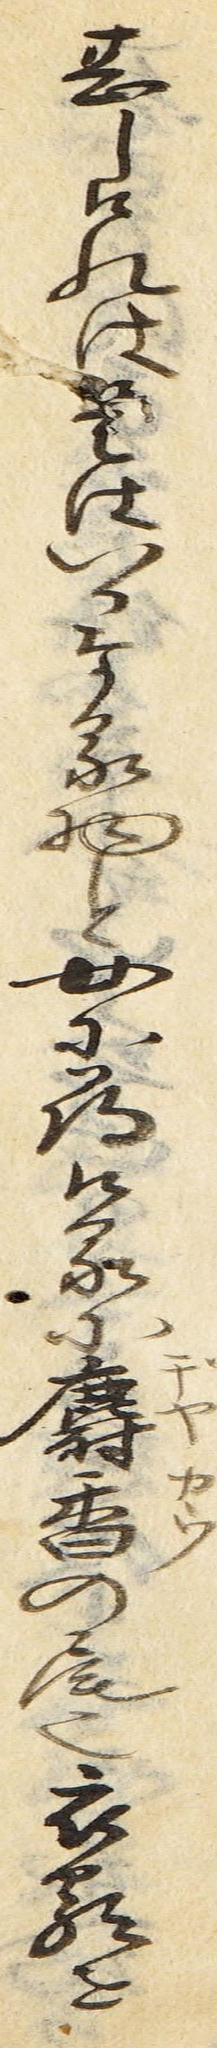甚しけれは是はいかなる物と女に尋けるに麝香の尾也衣類を
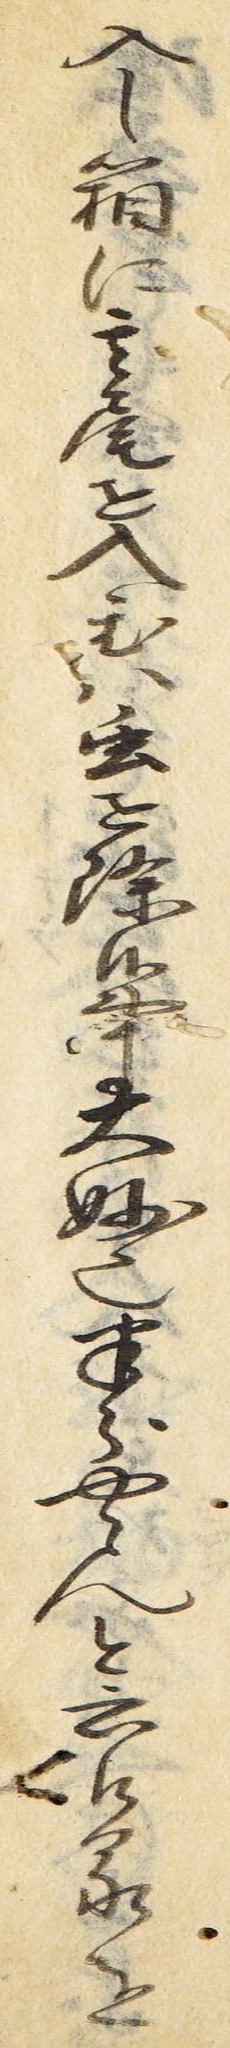入し箱に其尾を入置は虫を除候事大妙也はらやらんと云けるを

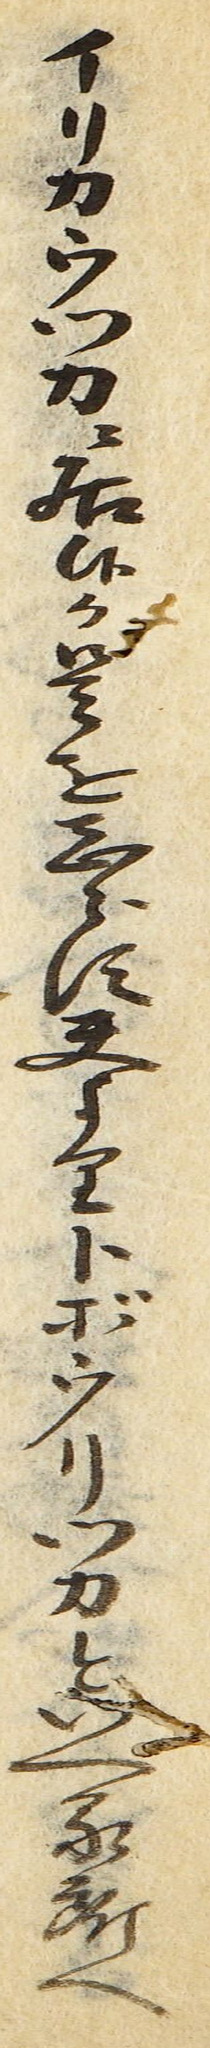イリカウツカに居候か是をしらす夫よりトボウリツカといへる所へ
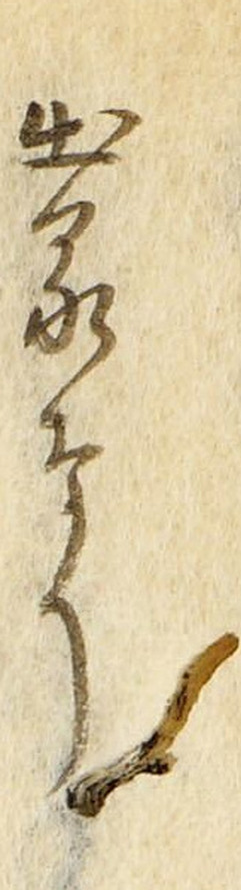出るなり
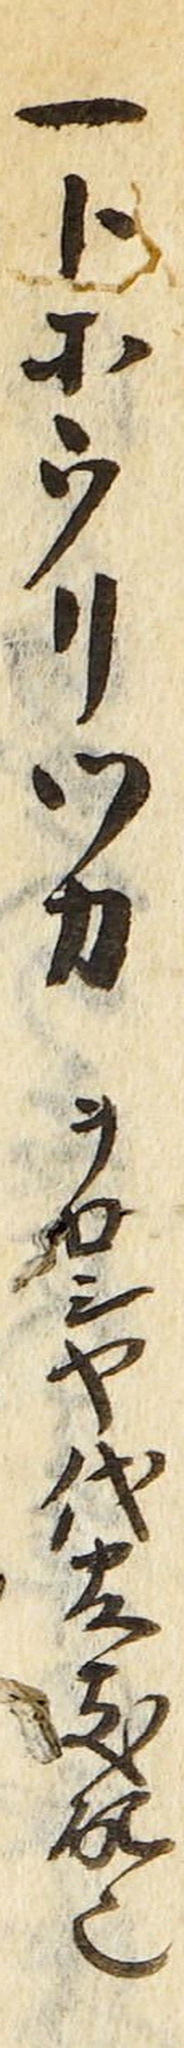一トホウリツカヲロシヤ代官支配也
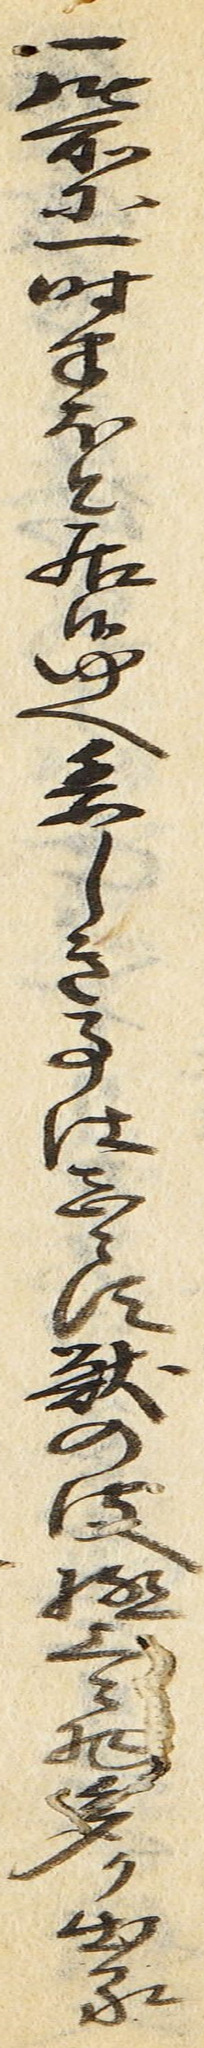一此所に一時半ほと居候ゆへ委しき事はしらす獣の皮極上之物多く出る
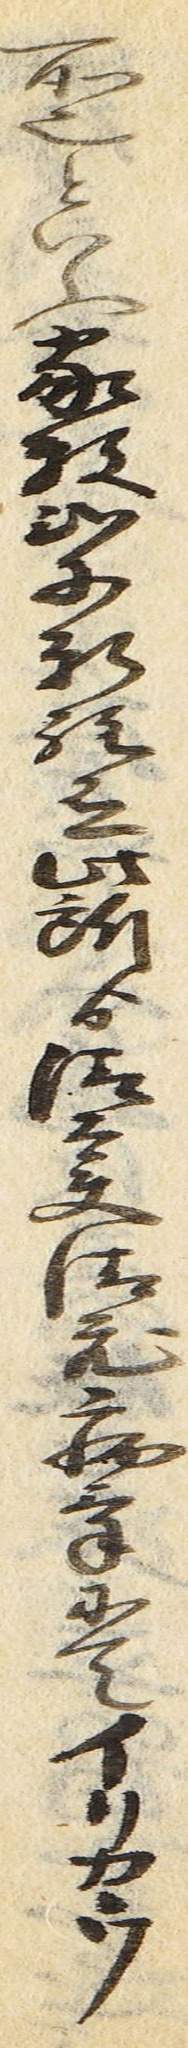所也といふ家数弐千軒程有此所ゟ清太夫清蔵病気にてイリカウ
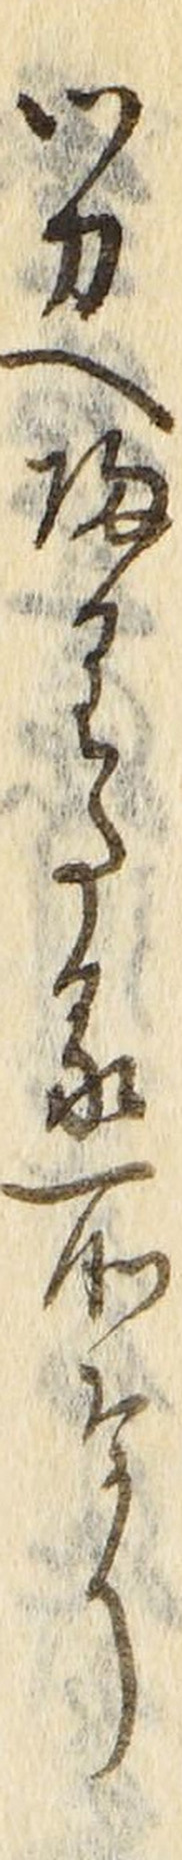ツカへ帰りたる所なり
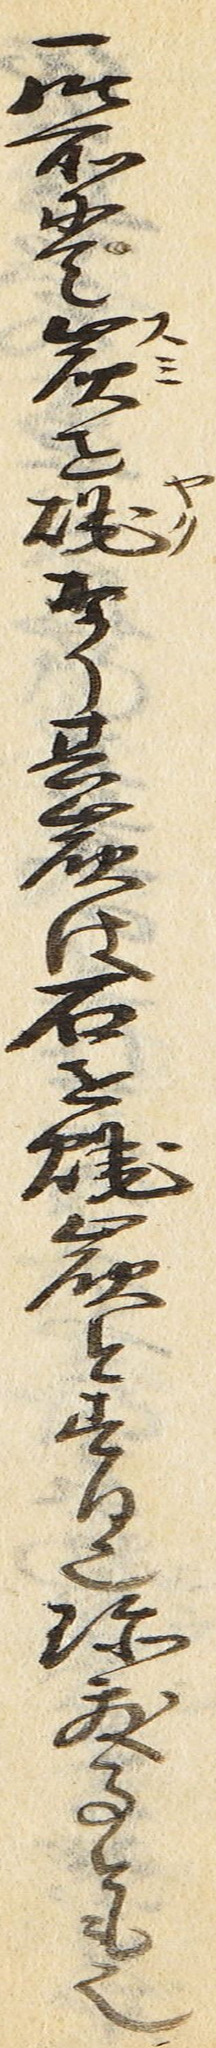一此所にて炭を焼なり其炭は石を焼炭とする也珍敷事とも也
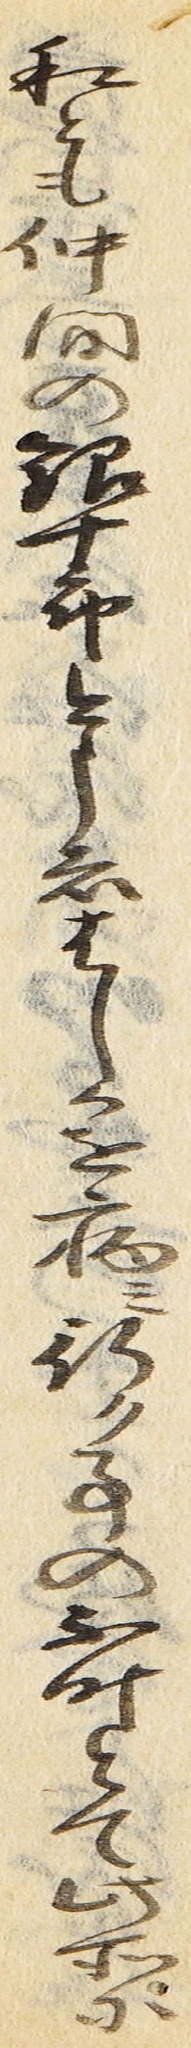私とも仲間の銀十郎と申者はしかを病み行く事の不叶とて此所に
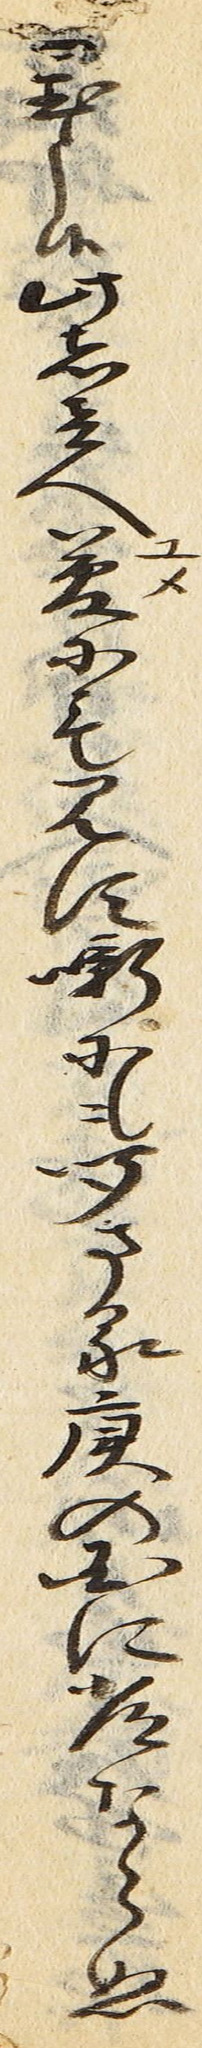置申し候此者壱人夢にも見す噺にも聞さる庚の国に常ならぬ
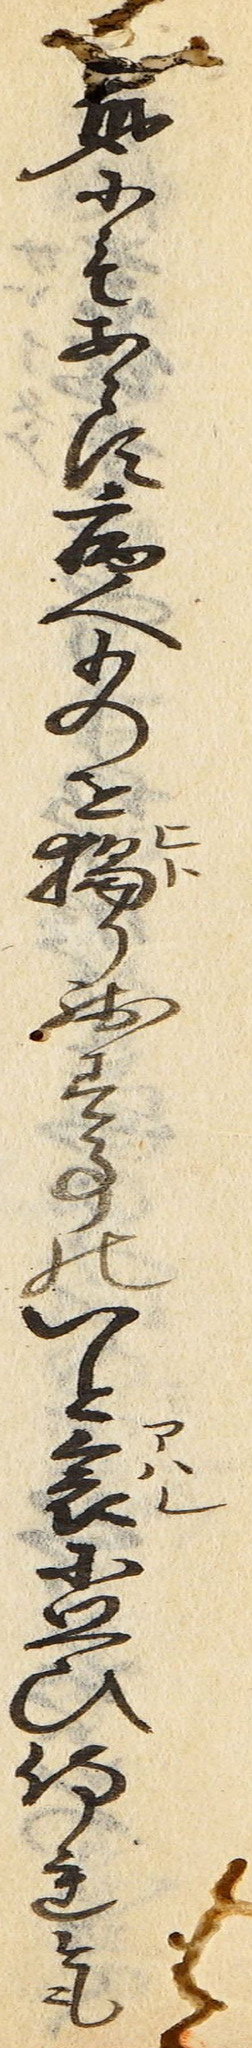身にもあらす病人ものを独り残す事のいと哀に思ひれとも
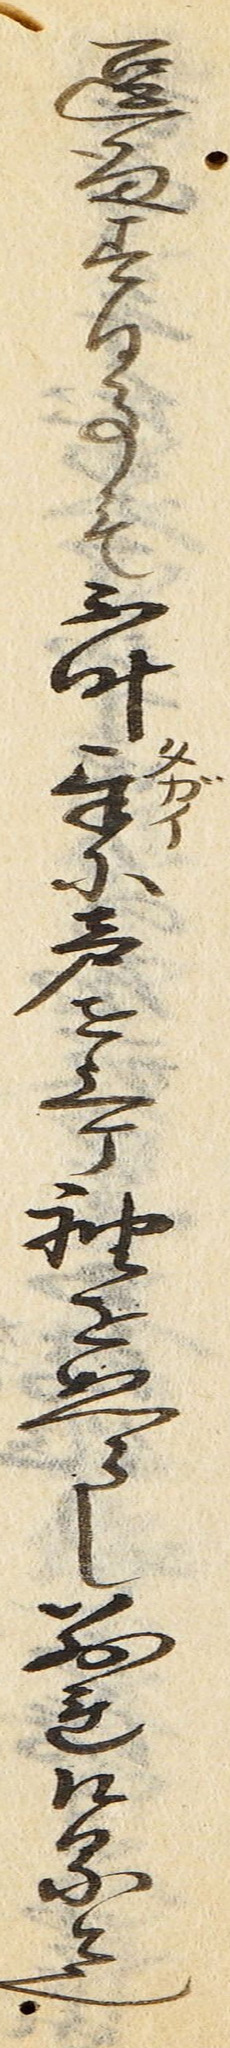逗留する事も不叶互に声を上け袖をぬらし別れけると也
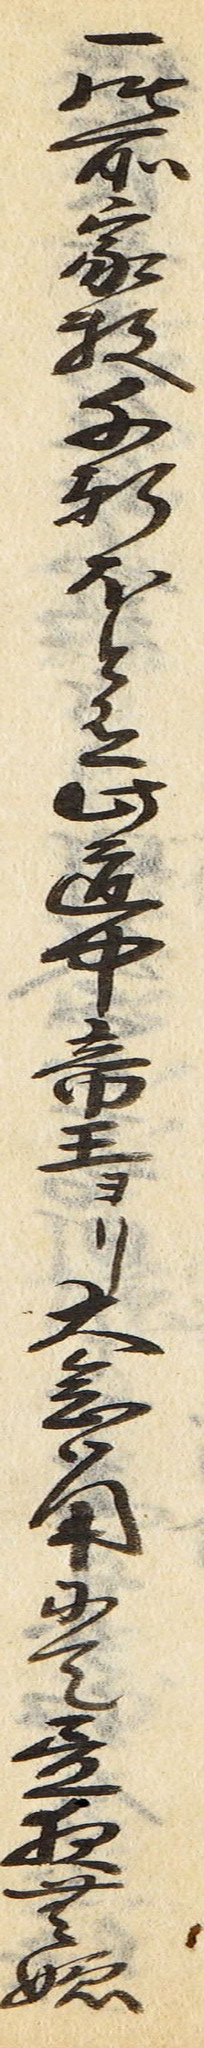一此所家数千軒ほと有此道中帝王より大念御用にて昼夜無嫌
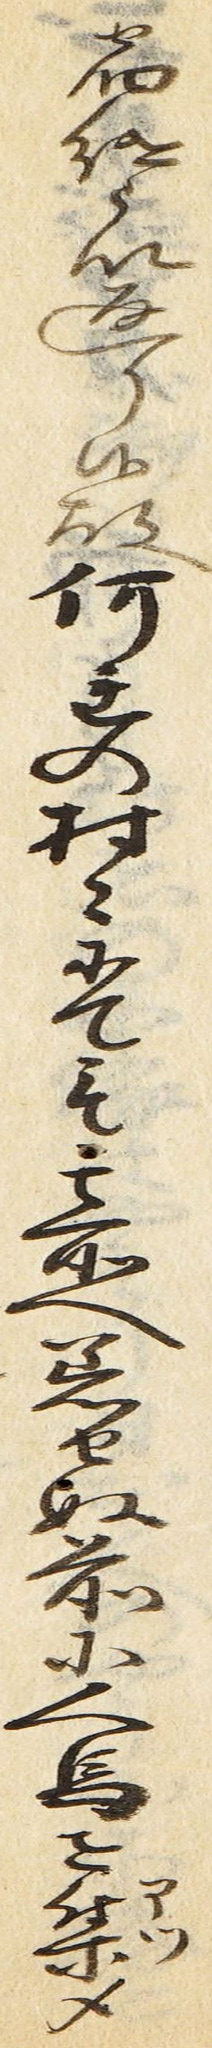宿継を以通り候故何れの村々にても其所へ着せぬ前に人馬を集め
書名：外国漂流記
